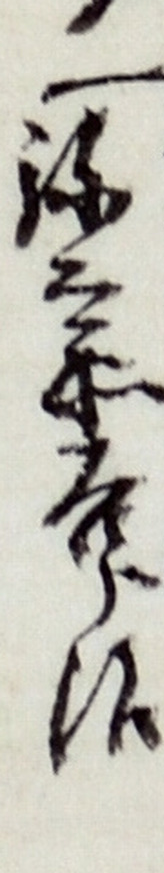弥兵衛吉郎治
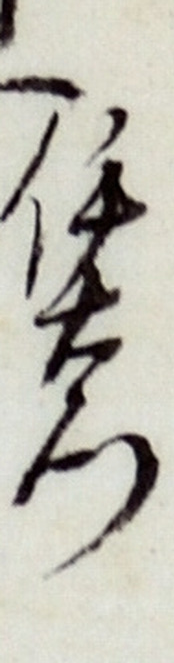伊右衛門
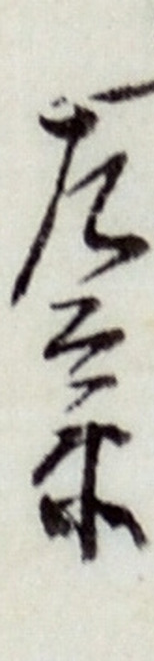左兵衛
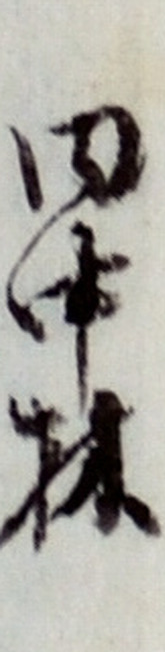田中林
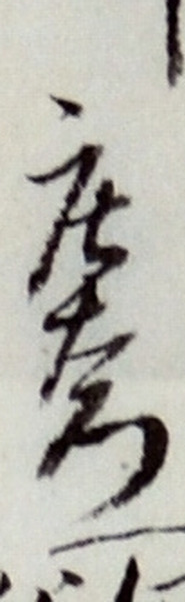伊右衛門
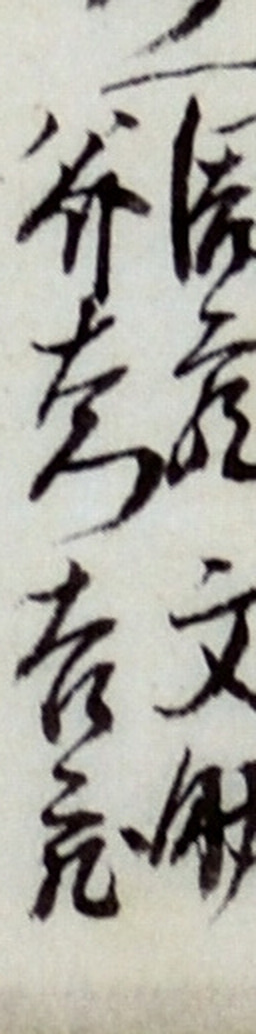斧右衛門吉蔵
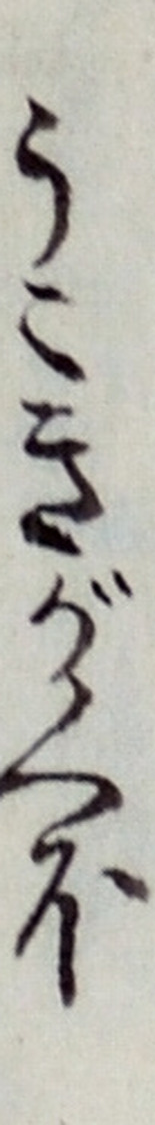うこきがくほ
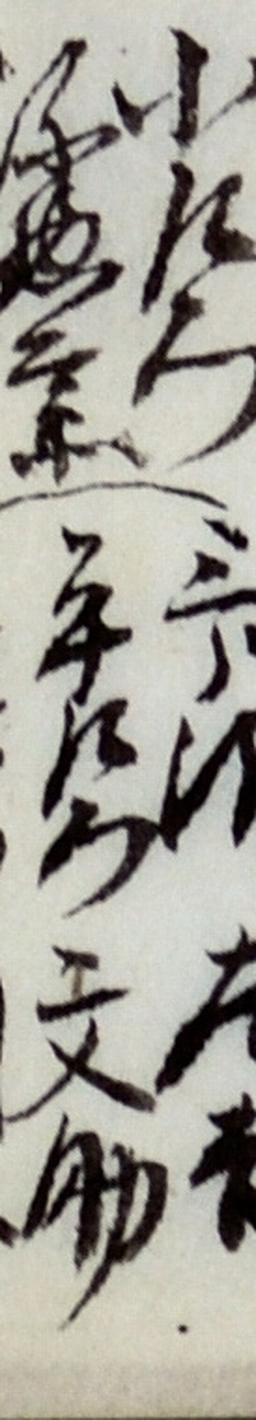弥惣兵衛平左衛門文助
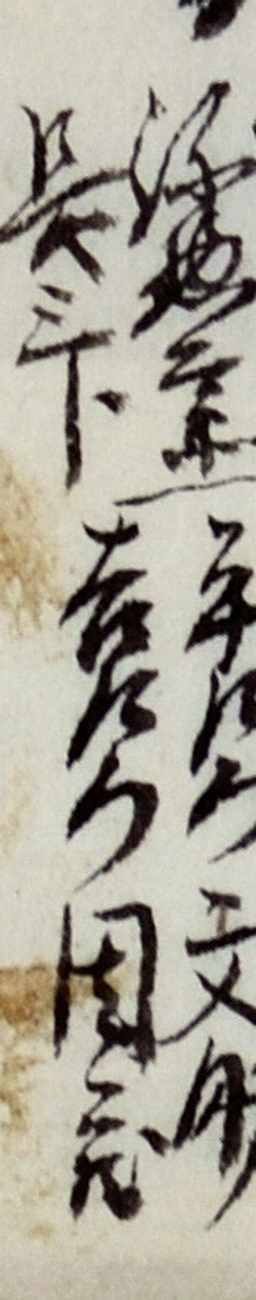長三郎吉左衛門周蔵
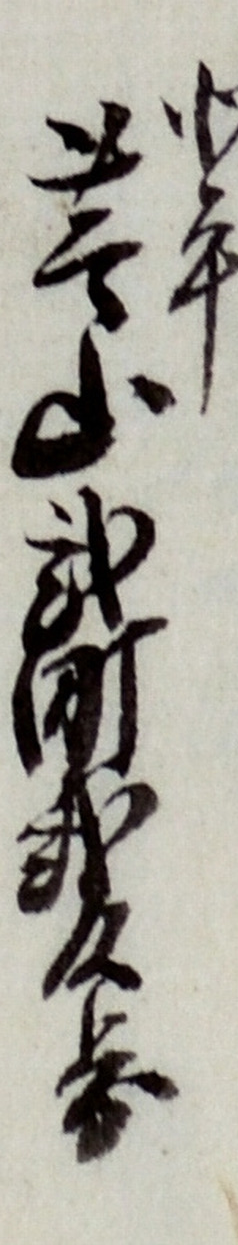芝山弐町弐反歩村中
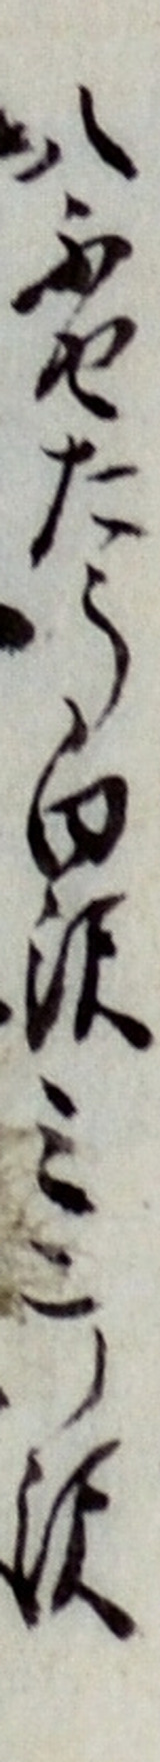八ふせたら白沢みこノ沢
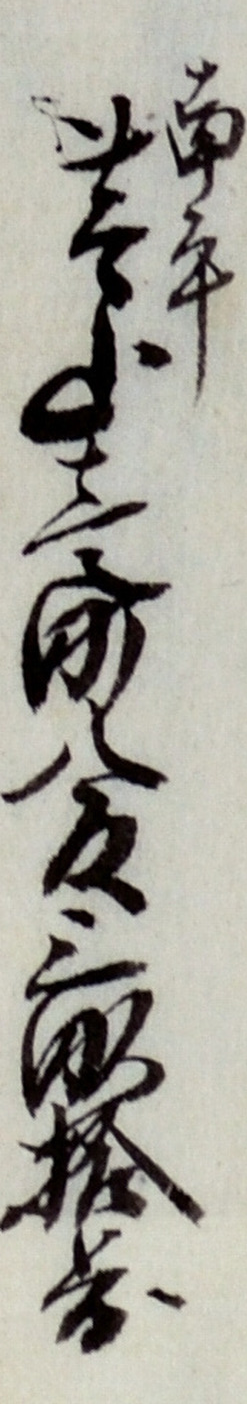芝山壱町八反三畝拾歩同断
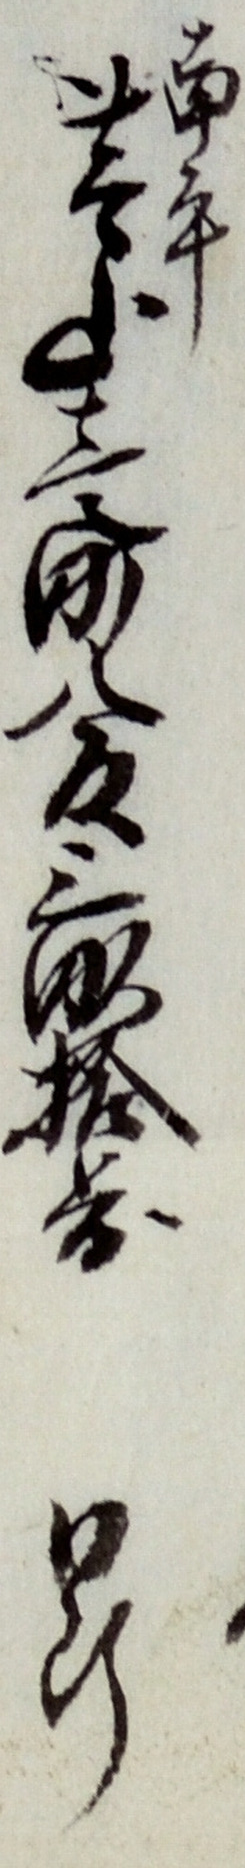芝山壱町八反三畝拾歩同断
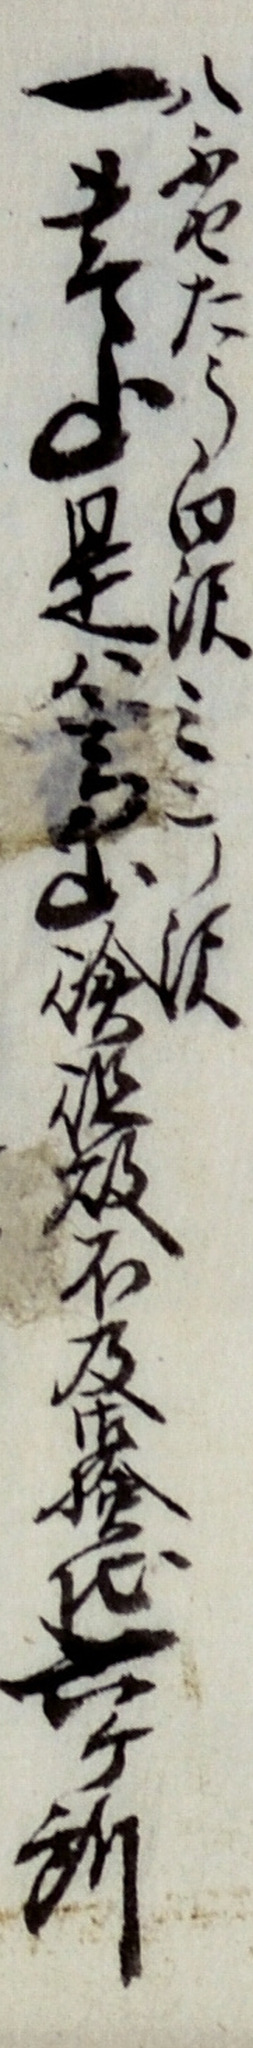一芝山是ハ高山嶮阻故不及御検地六ケ所
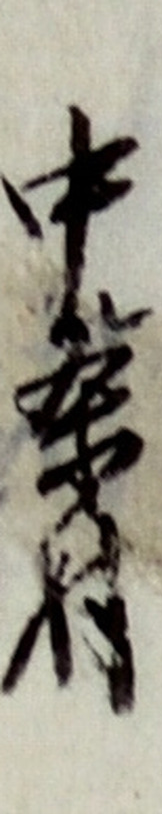中条村
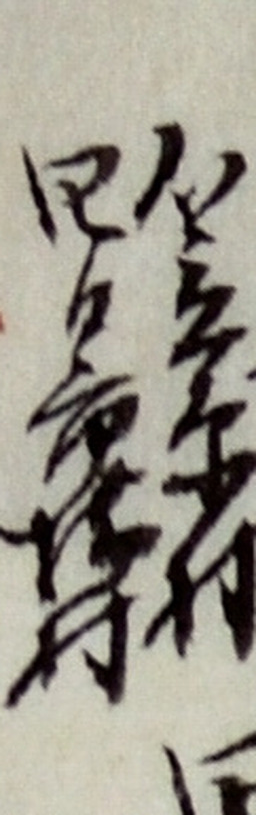四日市場村
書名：御領分中山林社地手控
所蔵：伊那市立高遠町図書館・合同会社AMANE
